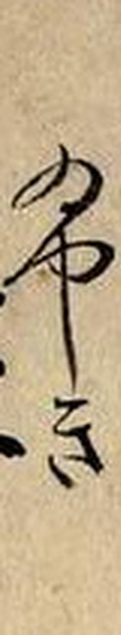ゐやしき
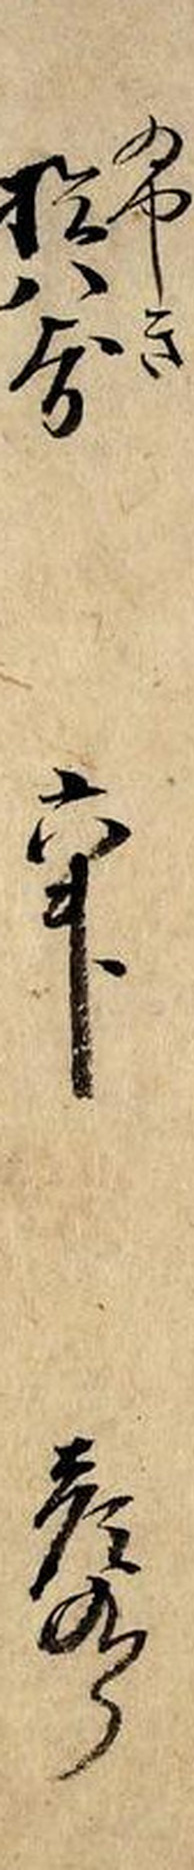拾八歩六升彦九郎
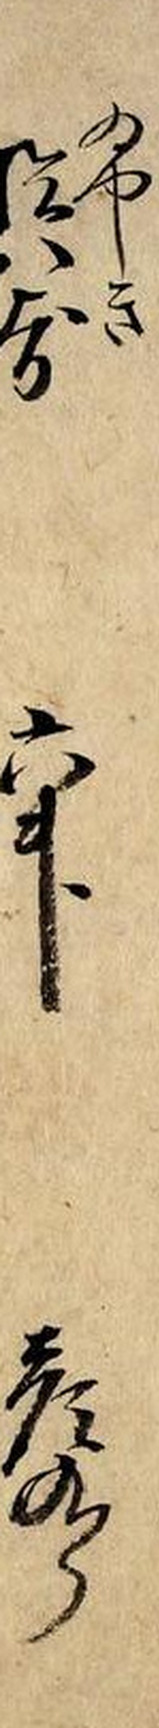拾八歩六升彦九郎
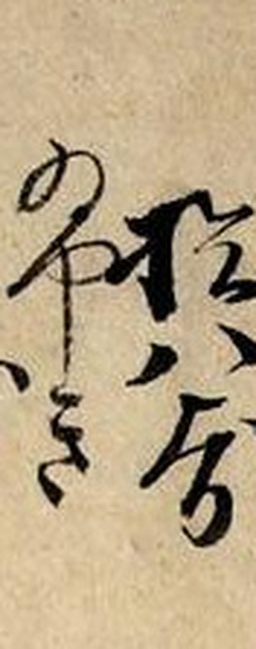ゐやしき
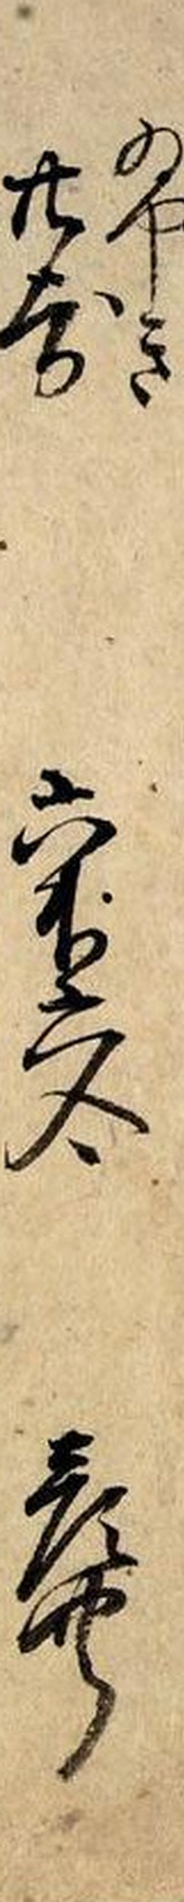廿歩六升六合彦四郎
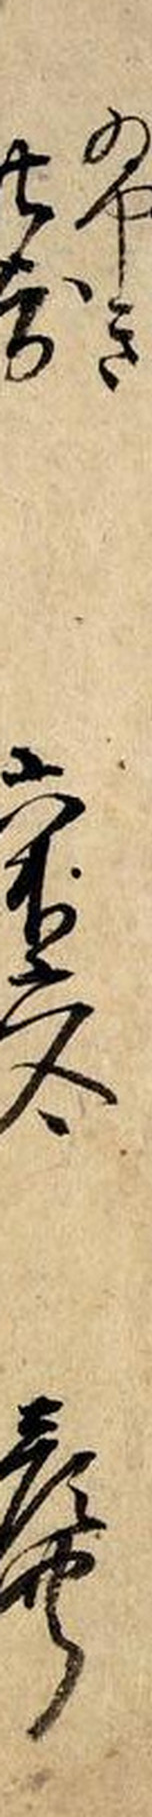廿歩六升六合彦四郎
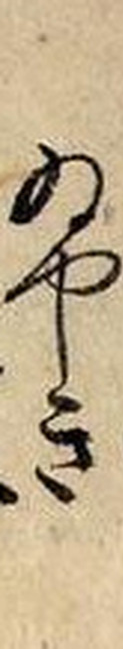ゐやしき
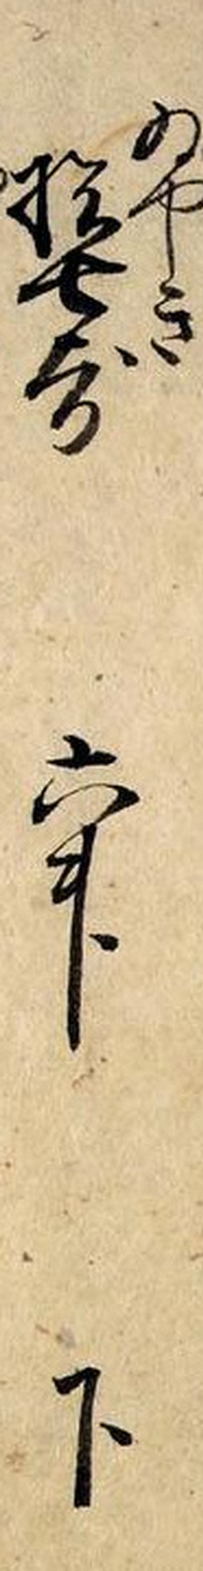拾七歩六升下
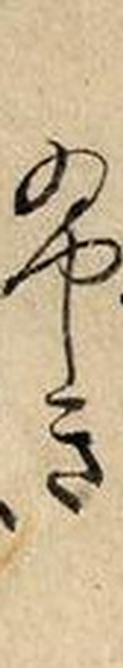ゐやしき
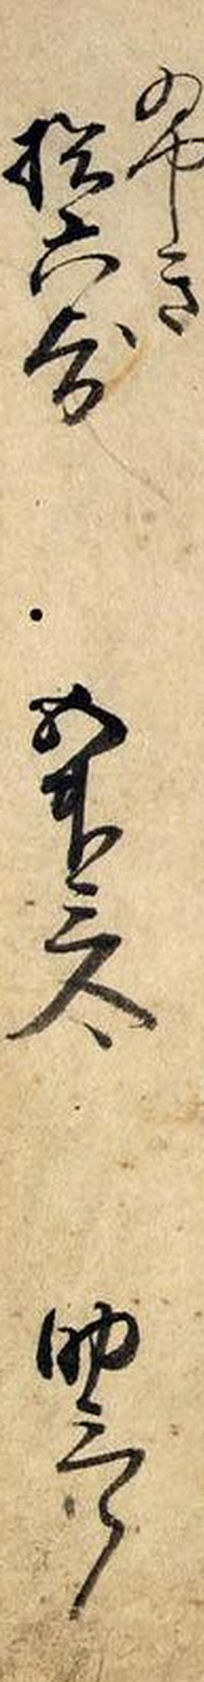拾六歩五升三合助三郎

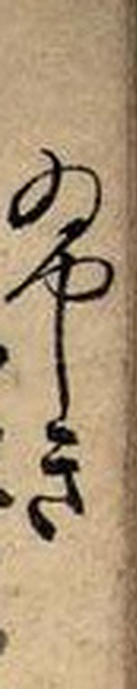ゐやしき
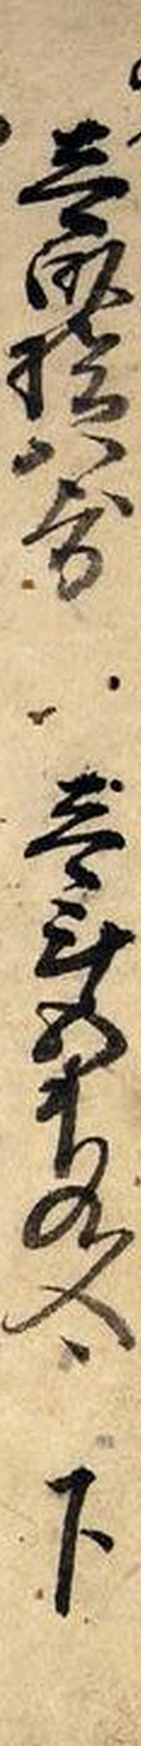壱畝拾八歩壱斗五升九合下
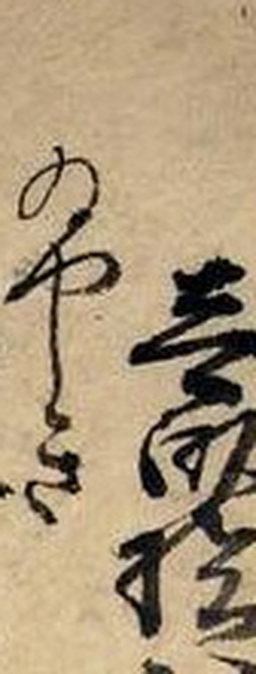ゐやしき
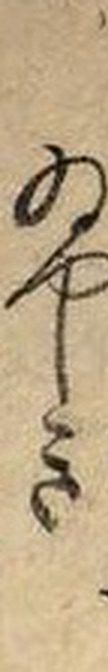ゐやしき
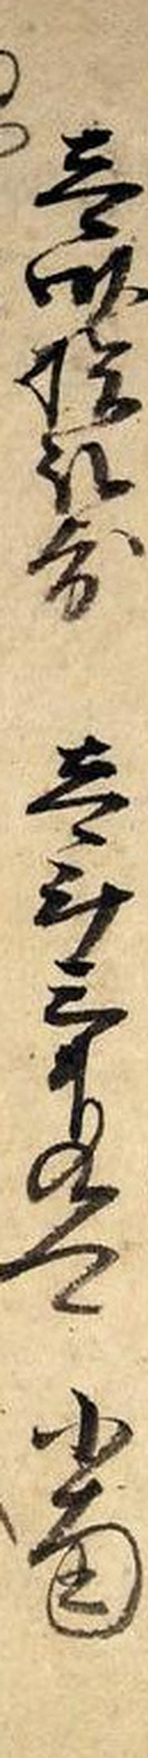壱畝拾弐歩壱斗三升九合小南
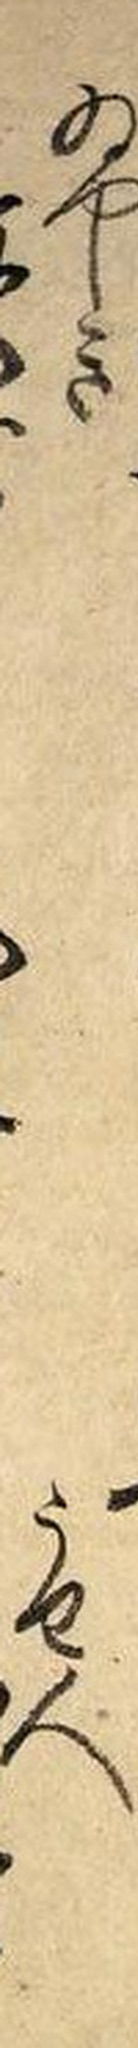ゐやしきうせ人
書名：若州三方郡之内世久見浦御検地帳（世久見浦検地帳写）
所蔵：福井県文書館 Fukui Prefectural Archives
